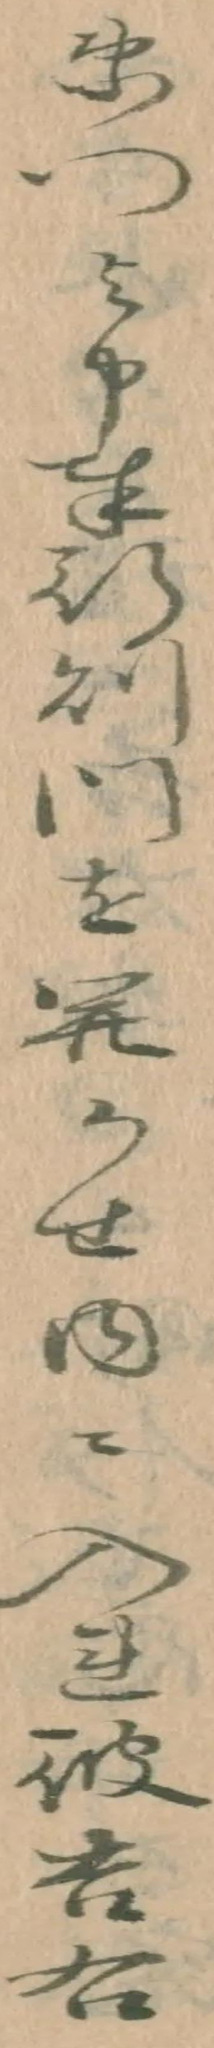衛門与申奉行則門を開かせ内に入連彼吉右
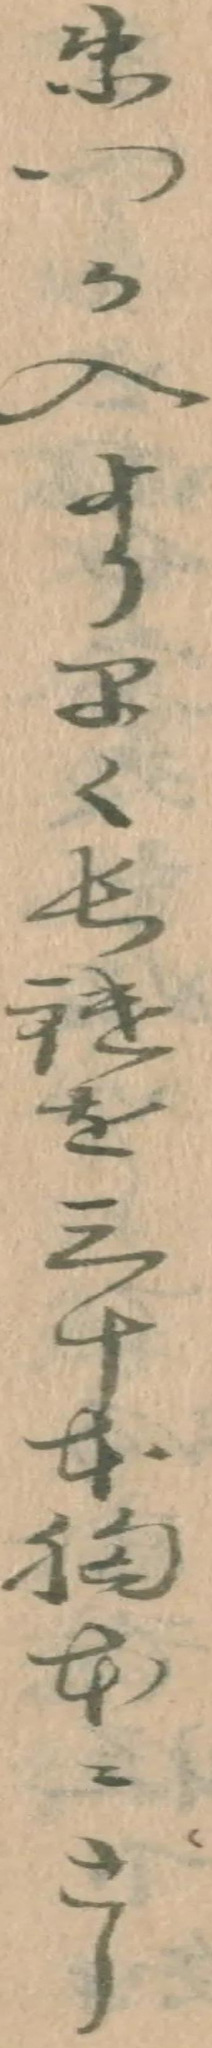衛門か入より早く長鑓を三十本胸本にさし
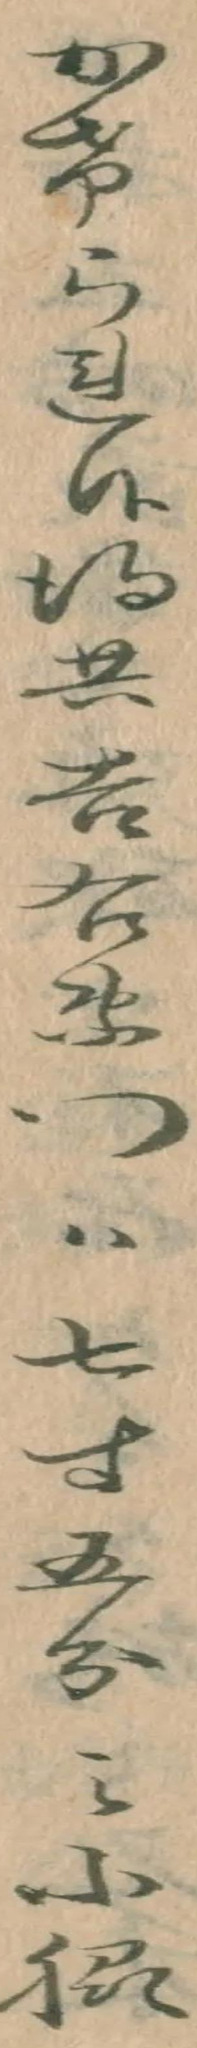か希ら連候得共吉右衛門は七寸五分之小脇
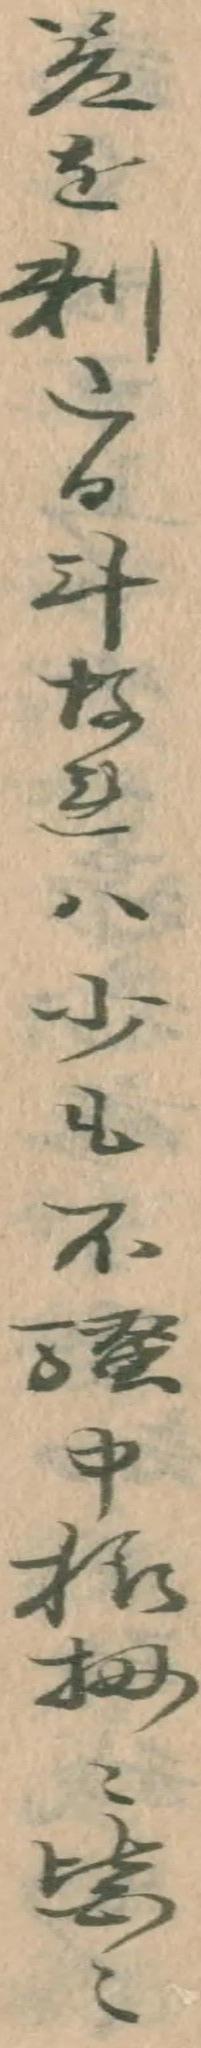差を刺たる斗な連は少も不騒申様扨に皆々
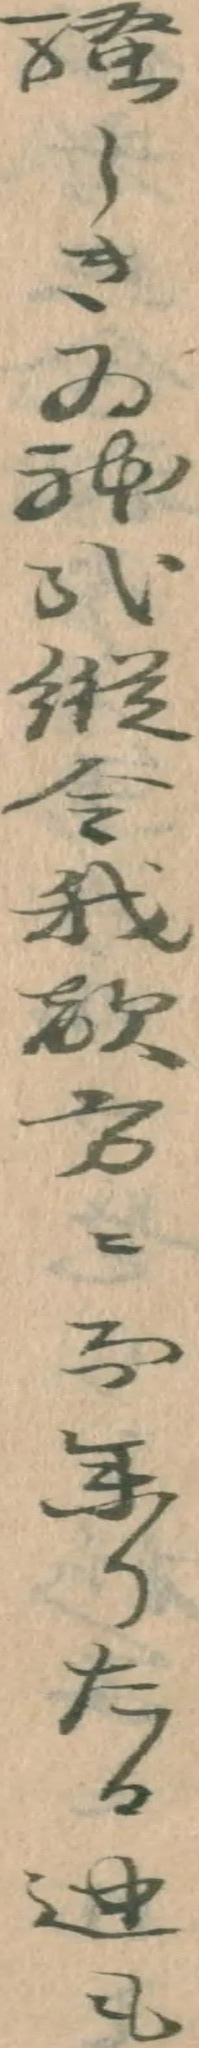騒しきゐ躰哉縦令我敵方に而参りたる迚も
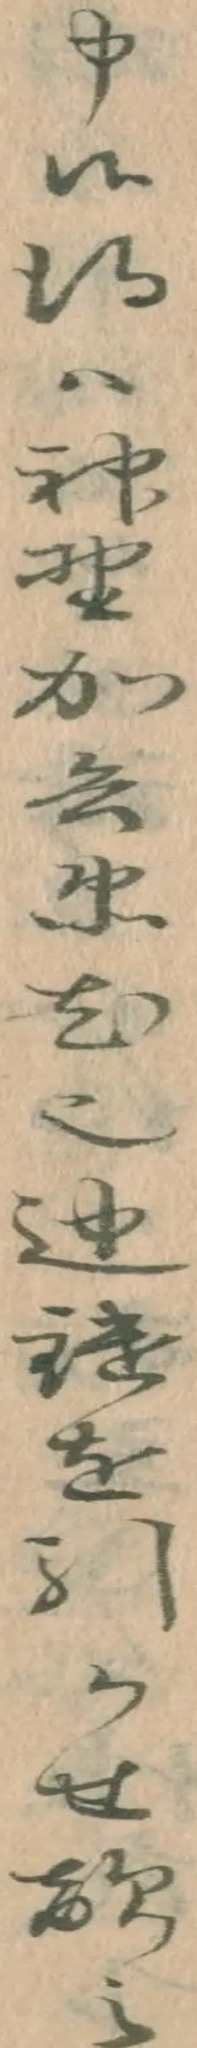申候得は神野加兵衛尤也迚鑓を引かせ敵之
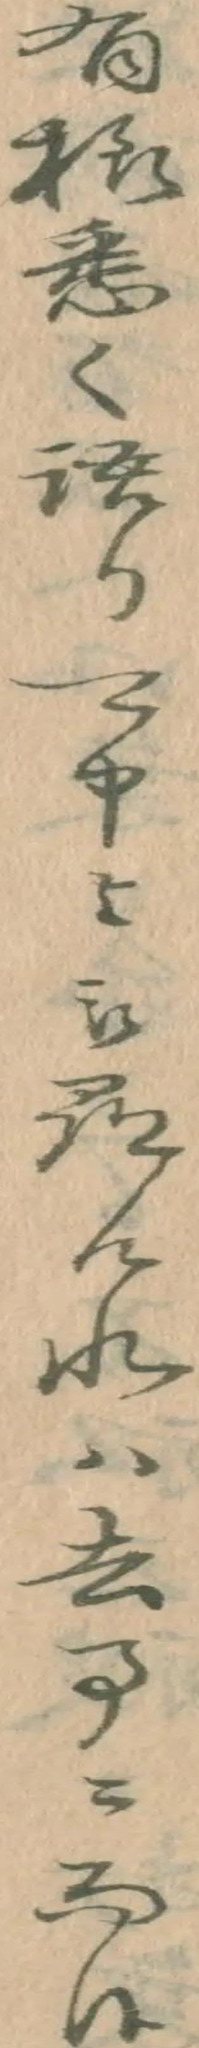有様悉く語り可申与被尋けれは去事に而候

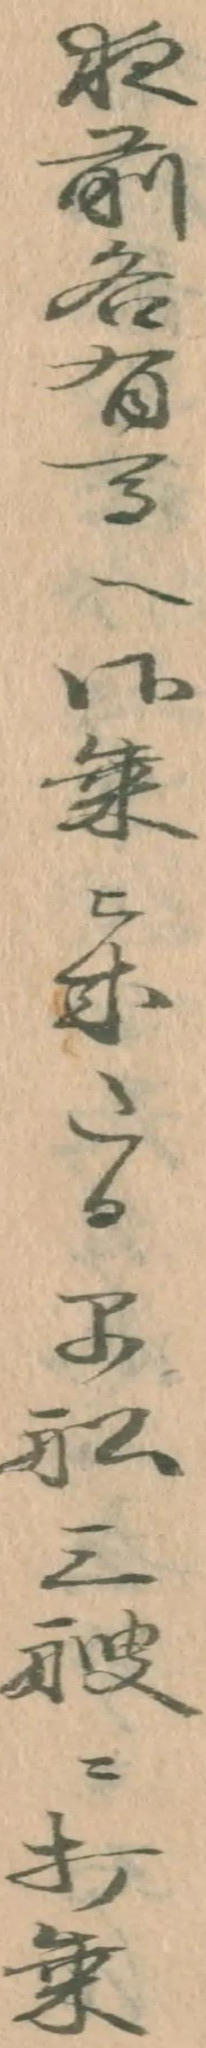夜前各有馬へ御乗に成たる早船三艘に打乗
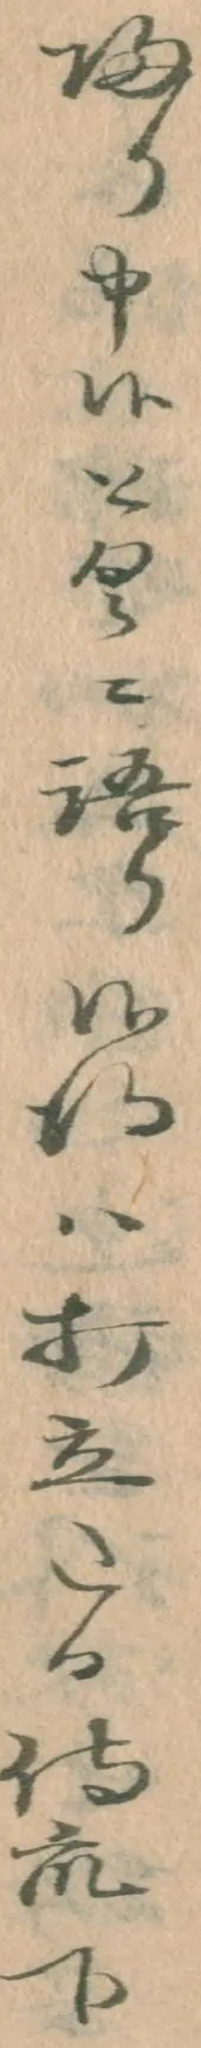帰り申候と具に語り候得は打立たる侍衆下
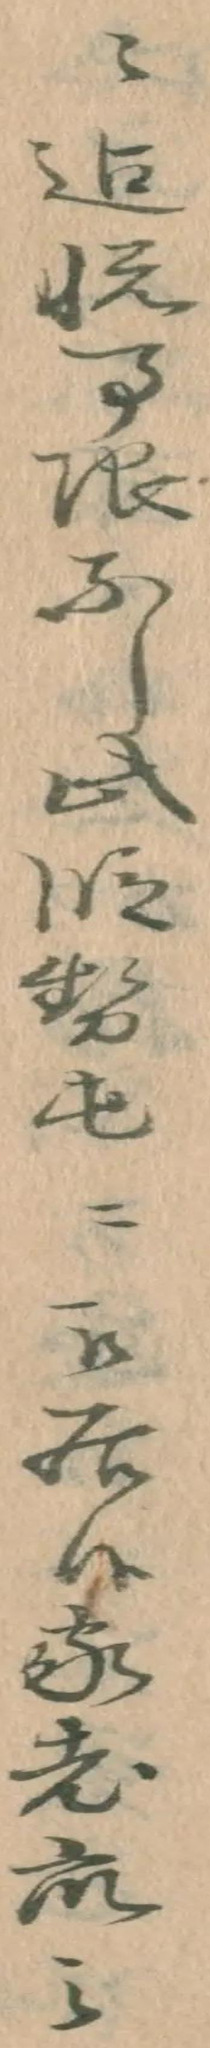々迄悦事限なし此段勢屯に被居候家老衆之
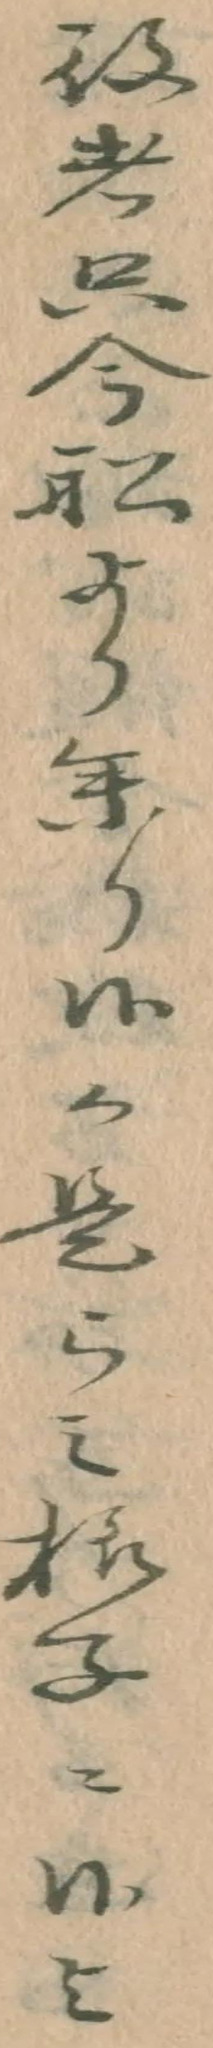役者只今舩より参り候か是ら之様子に候与
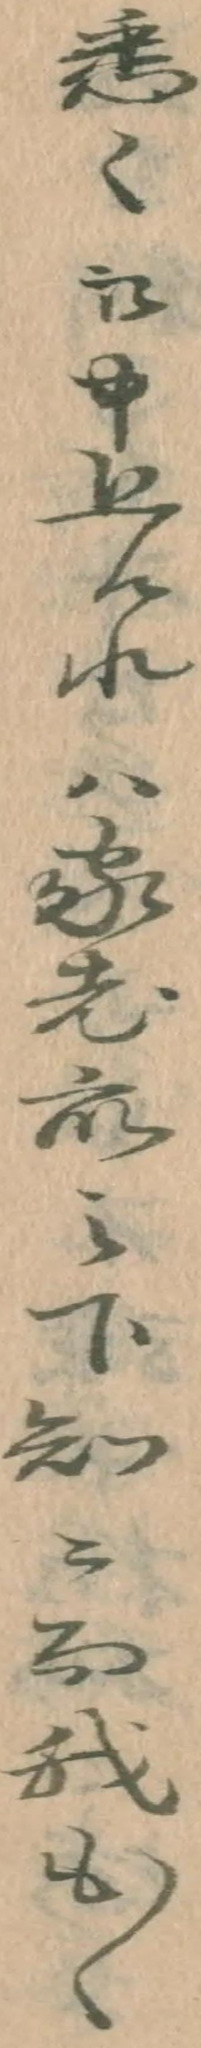悉く被申上けれは家老衆之下知に而我も〱
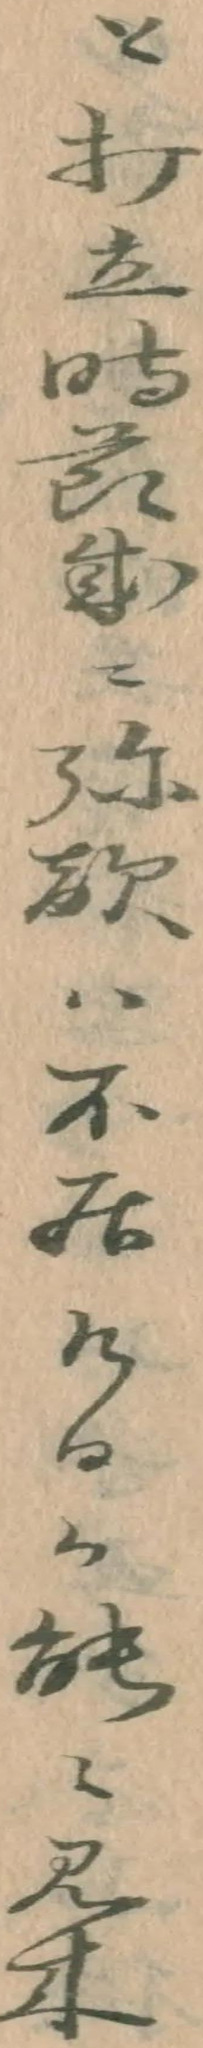と打立時節成に弥敵は不居けるか能々見来
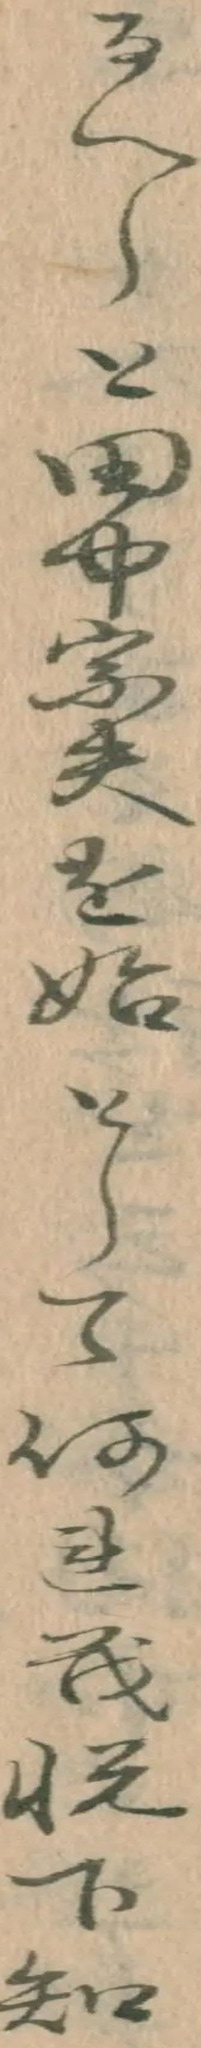るへしと田中宗夫を始として何連茂悦下知
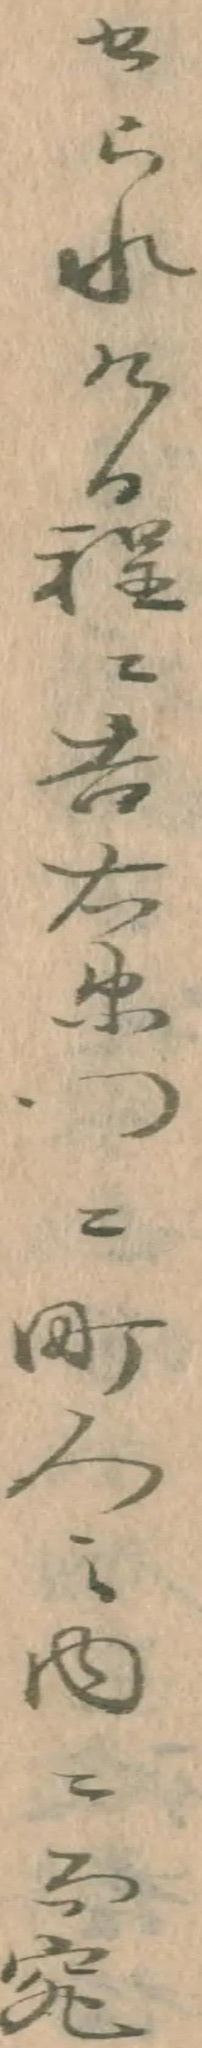せられける程に吉右衛門に町人之内に而究
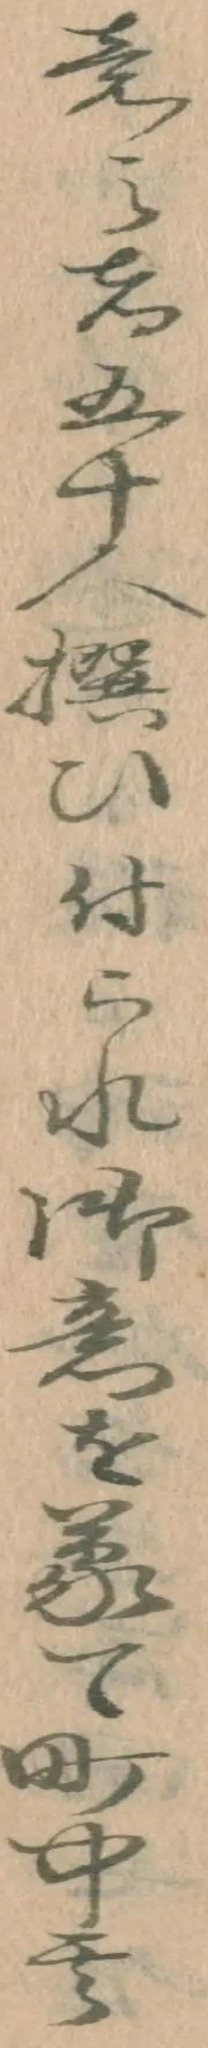竟之者五十人撰ひ付られ御意を承て町中其
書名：切支丹御退治記 49巻. [2]
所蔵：国立国会図書館 National Diet Library, JAPAN
